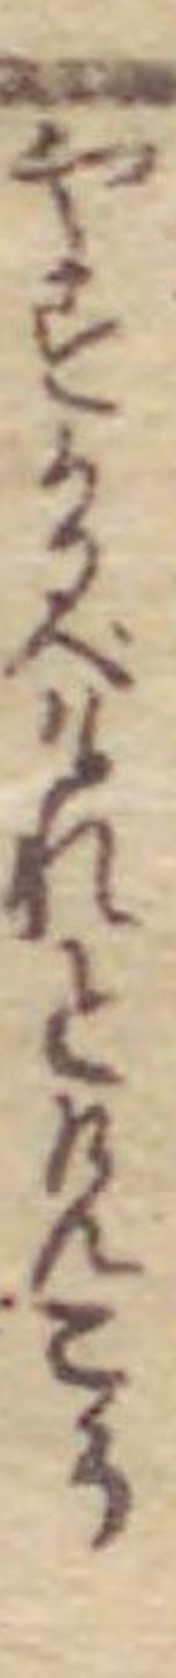やすかるべけれとけんこう
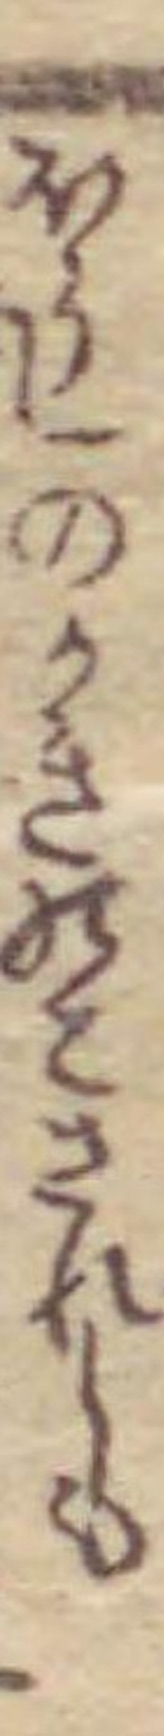ほうしのかきのこされしも
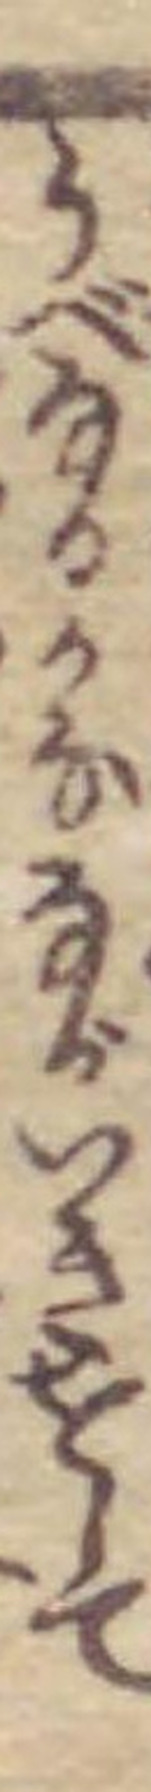うべなるかなながいきをして
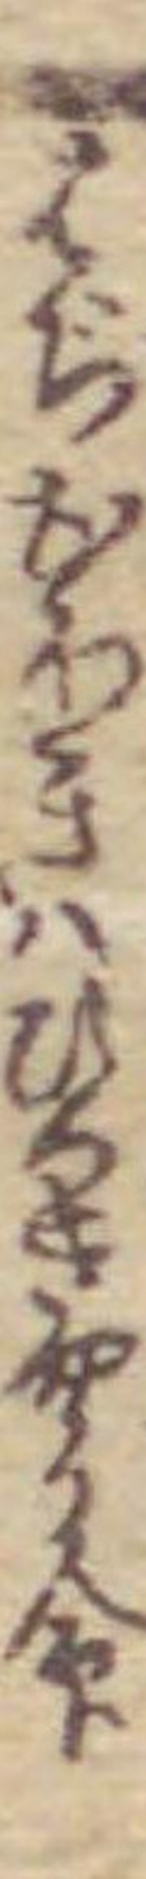はぢおほきはひつきやう命
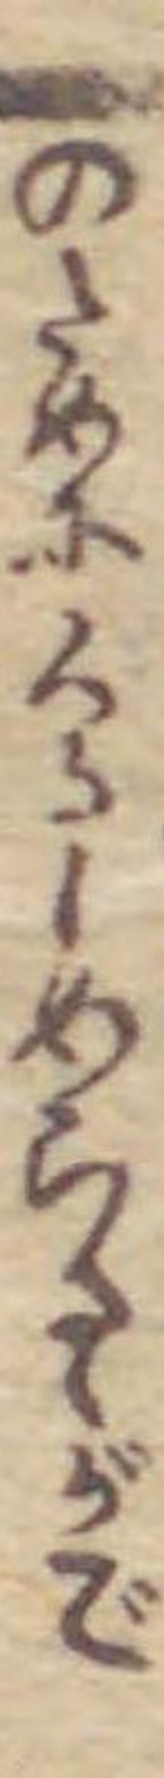のためにくるしめらるゝがご
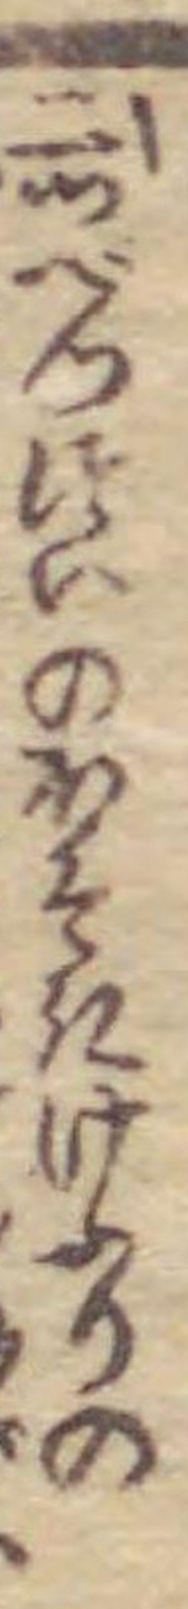〽一ツべつついのほそきけふりの
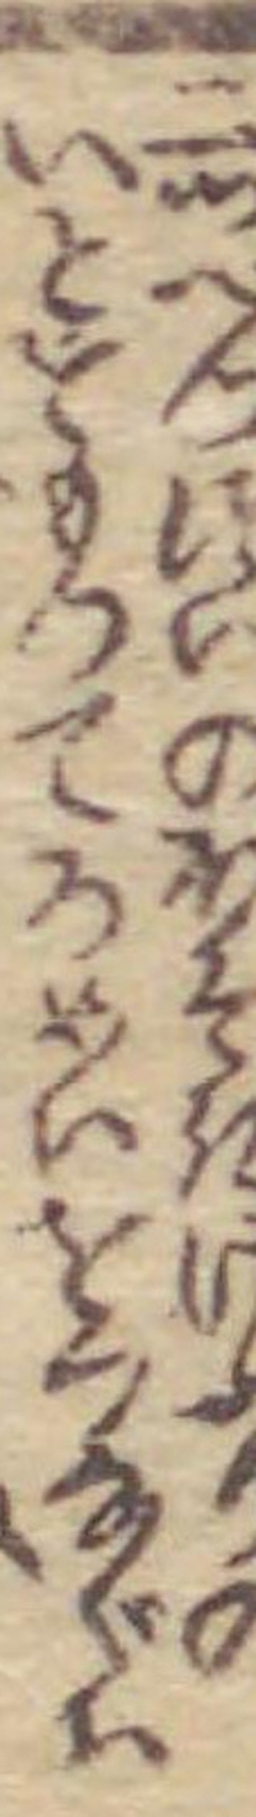いとをもつてろめいをつなぐは
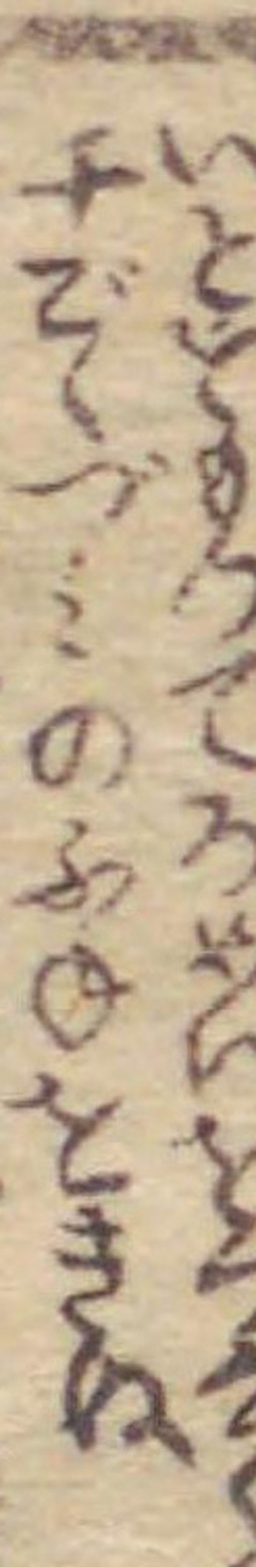千ごくづみのふねをきぬ
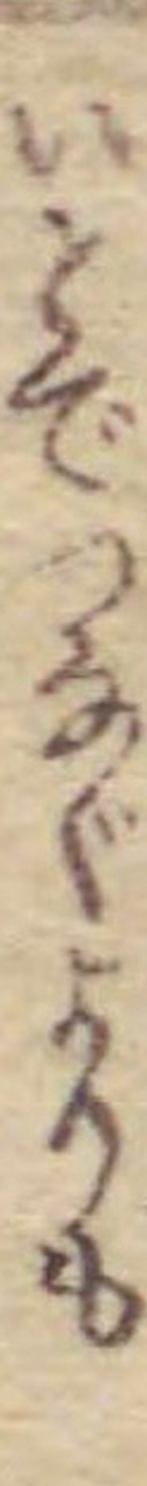いとでつなぐよりも
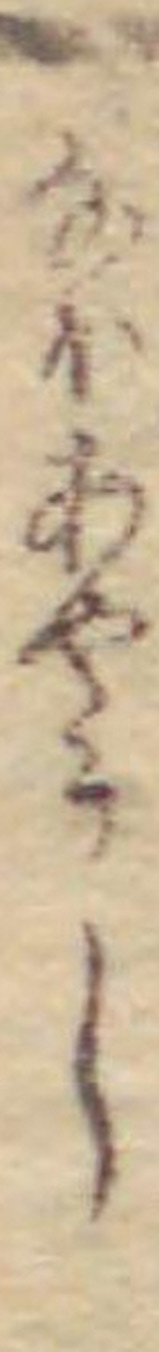なほあやうし

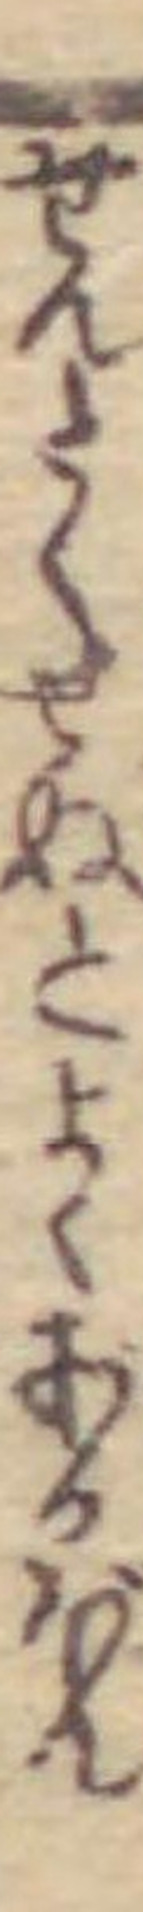せんたくせぬとよくあかぼん
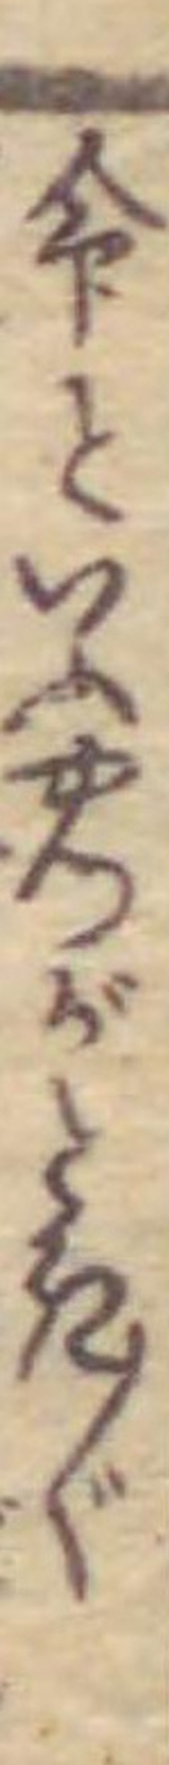命といふやつがとき〴〵
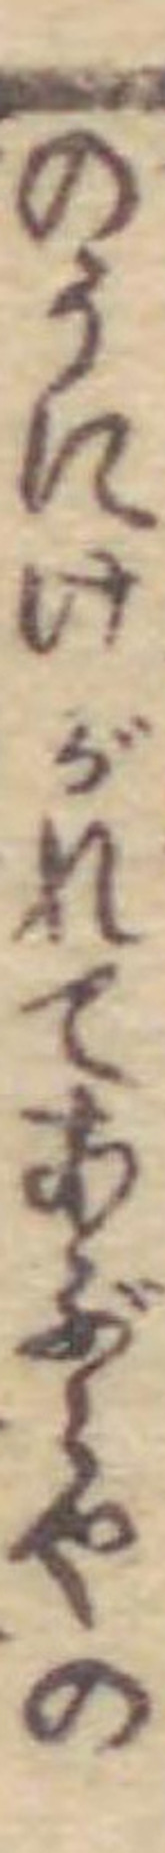のうにけがれてあぶらやの
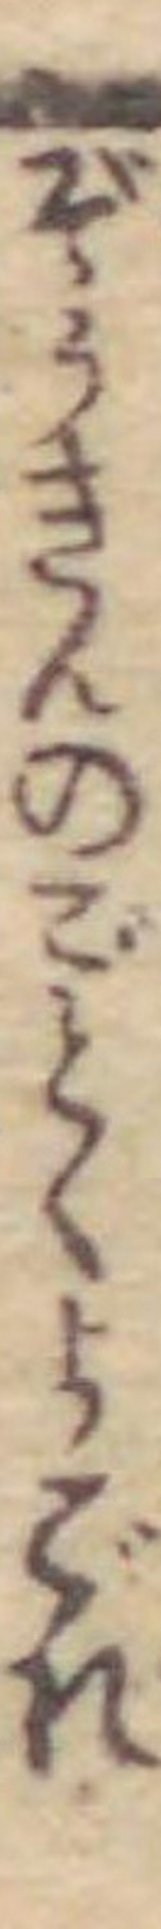ぞうきんのごとくよごれ
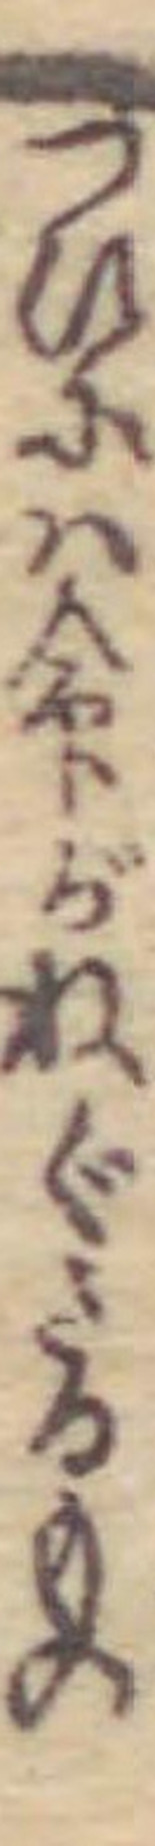つひには命がねぐたるもの
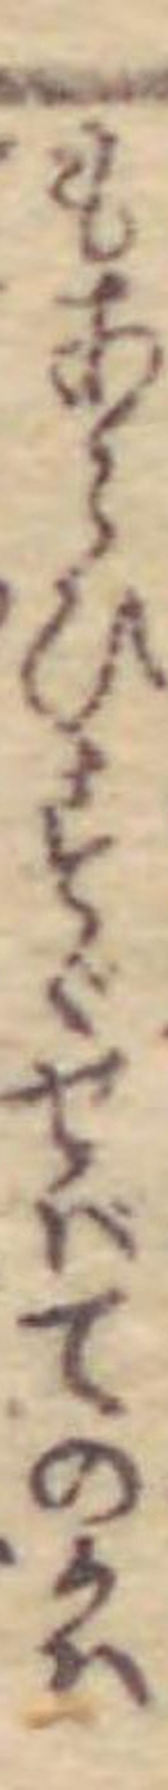もあらひすぐせばてのかは
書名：御誂染長寿小紋 : 3巻
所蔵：国立国会図書館 National Diet Library, JAPAN
